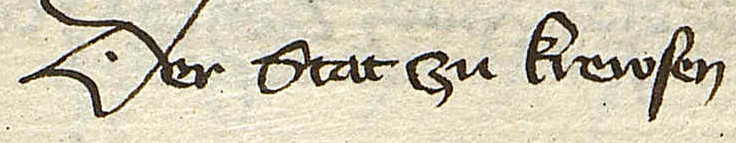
Der Stat cʒu krewſen
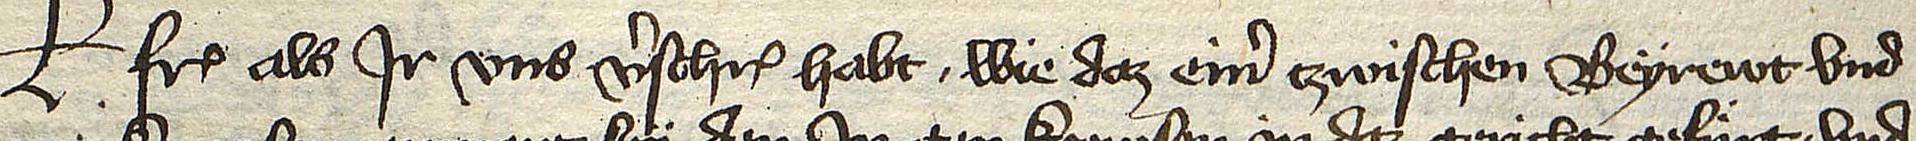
L* fr* als Ir vns v*ſchr* habt . wie daʒ ein* cʒwischen Beyrewt vnd
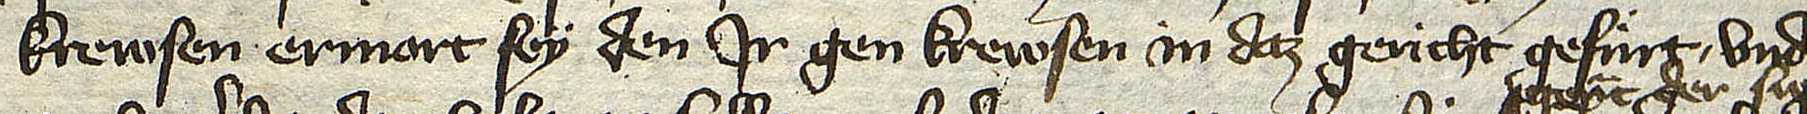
krewſen ermort ſey den Ir gen krewſen in daʒ gericht gefürt . vnd
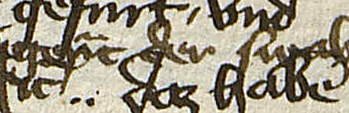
gent* der ſwab
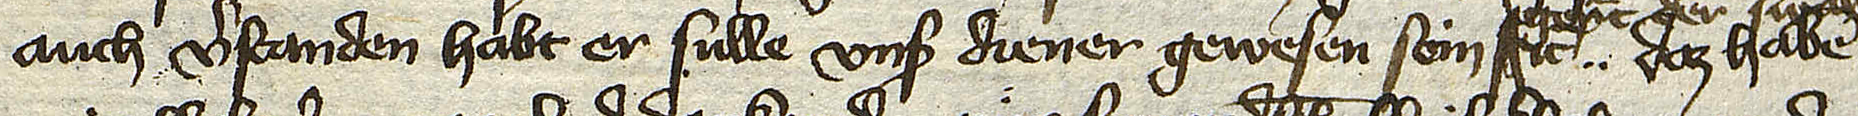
auch v*ſtanden habt er ſulle vnſ* diener geweſen ſein ec* ~ daʒ habe*
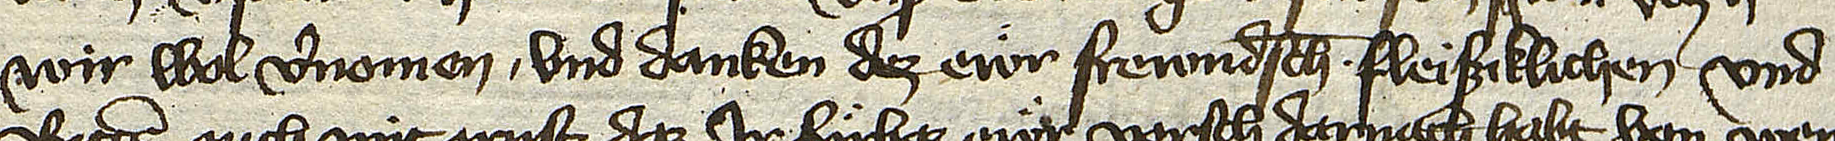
wir wol v*nomen / vnd danken deʒ ewr frewndſch* fleiſʒiklichen vnd
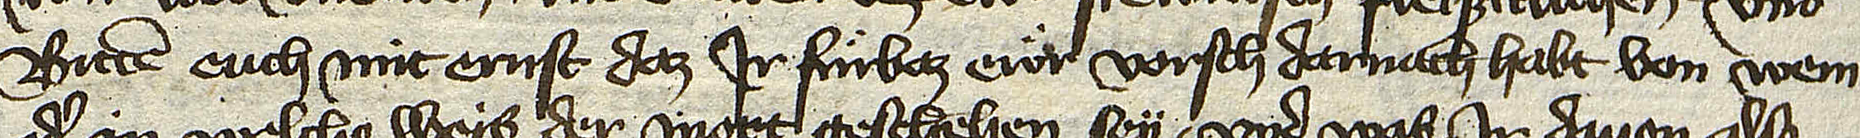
Bitte* euch mit ernſt daʒ Ir fürbaʒ ewr vorſch darnach habt von wem
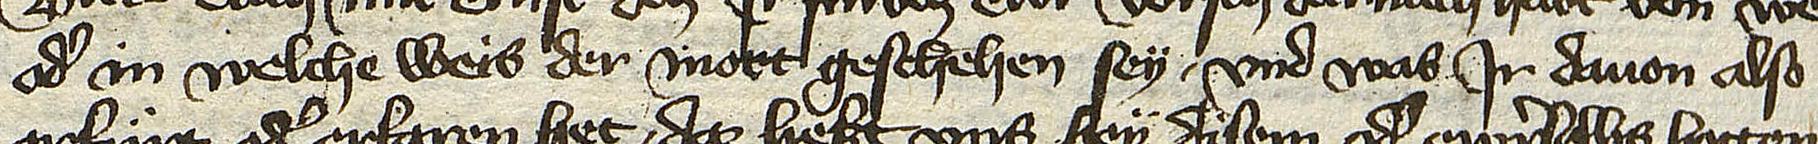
od* in welche weiʒ der mort geſchehen ſey / vnd was Ir dauon alſo
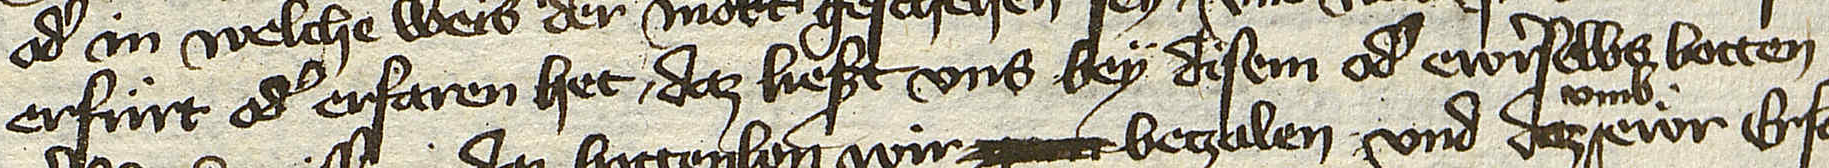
erfürt od* erfaren het / daʒ lieſʒt vns bey diſem od* ewr*ſelbs* botten
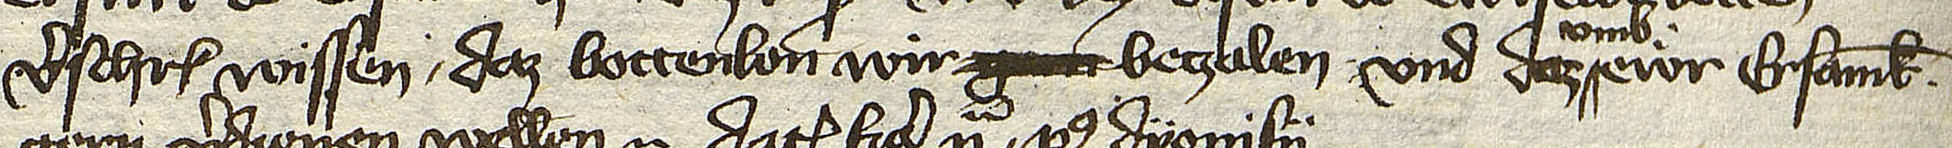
v*ſchr* wiſſen / daʒ bottenlon wir gern becʒalen . vnd daʒ ewr Erſamk*
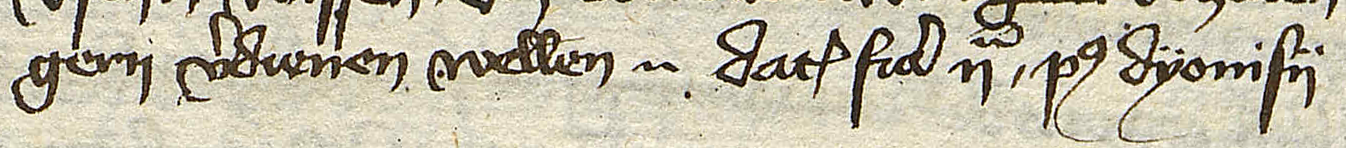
gern v*dienen wellen ~ dat* fia* ii* / p* dyoniſii
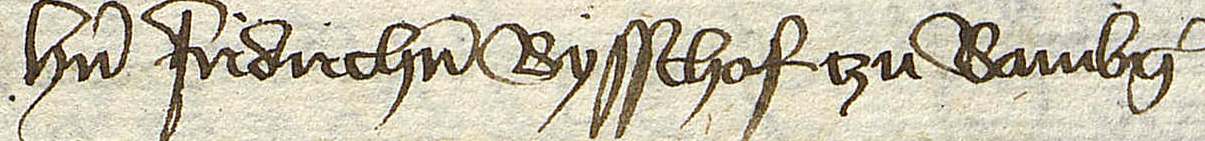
Hn* Fridrich*n Byſſchof cʒu Bambg*
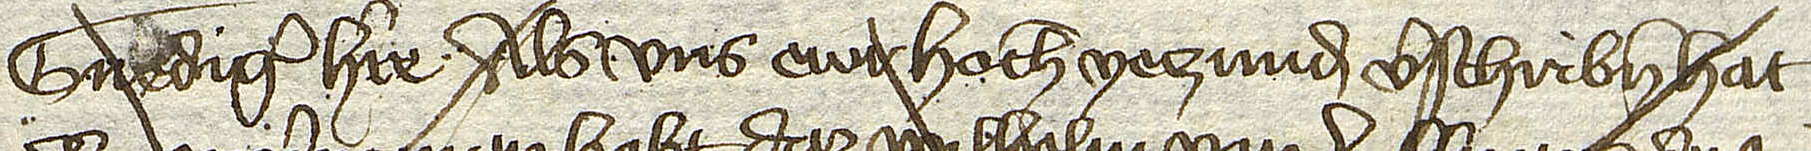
Gnedig* hre* Als vns ewr hoch* yecʒund* v*ſchrib*n hat
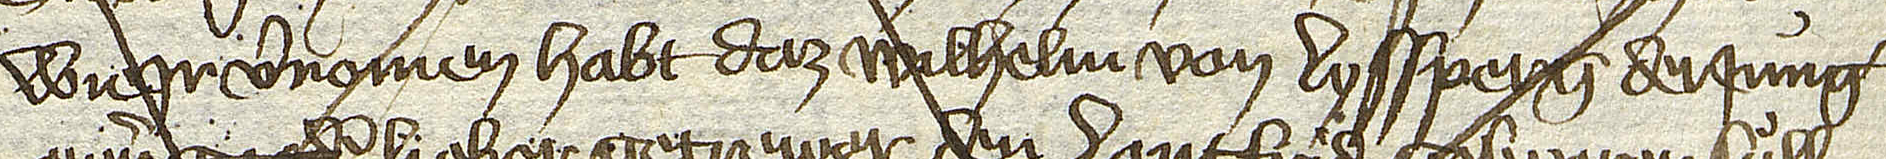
wie Ir v*nomen habt daʒ wilhelm von von lyſſperg* der Iüng*
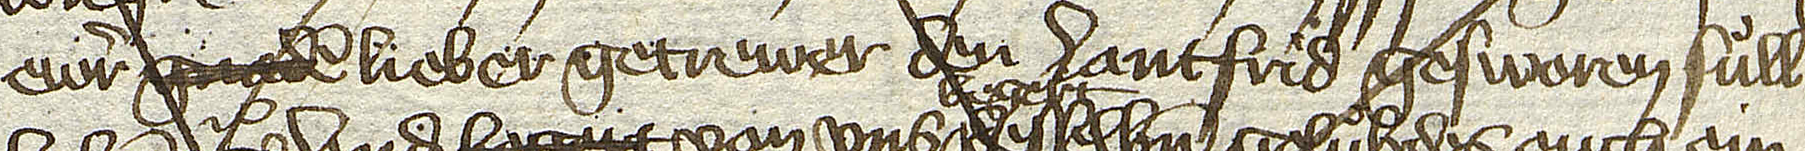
ew*r gnade* lieber getrewer den lantfrid geſworen ſüll
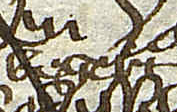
begert
